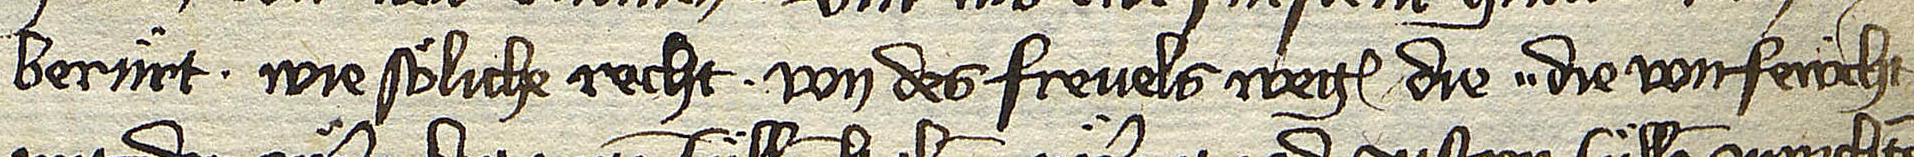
berürt . wie ſöliche recht . von des freuels weg* die ~ die von feẅcht
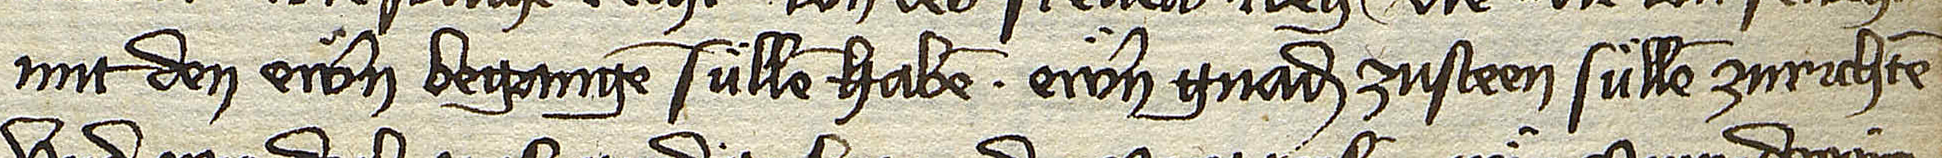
mit den eẅn* begange* ſülle* habe* . eẅn* gnad* ʒuſteen ſülle* ʒurichte*
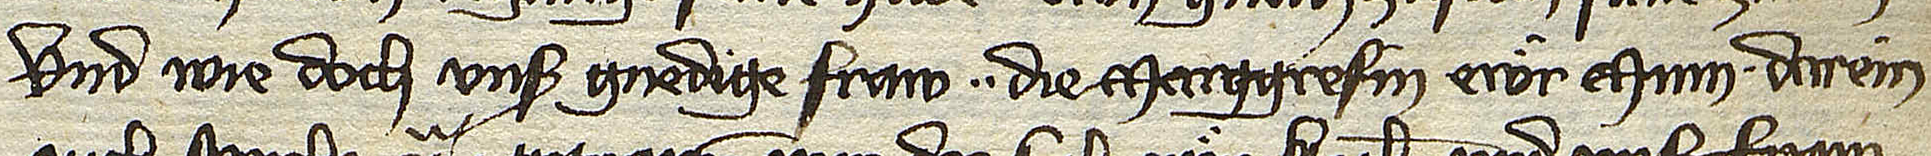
Vnd wie doch vnſ* gnedige fraw ~ die Marggrefin eẅr Mum darin
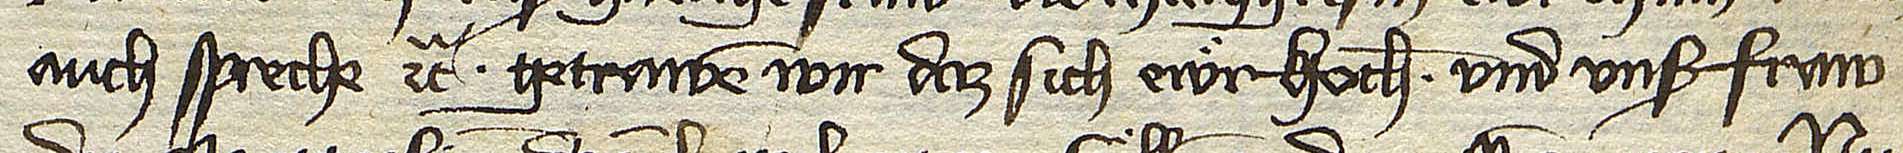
auch ſpreche ec* . getrawe* wir daʒ ſich eẅr hoch* . vnd vnſ* fraw
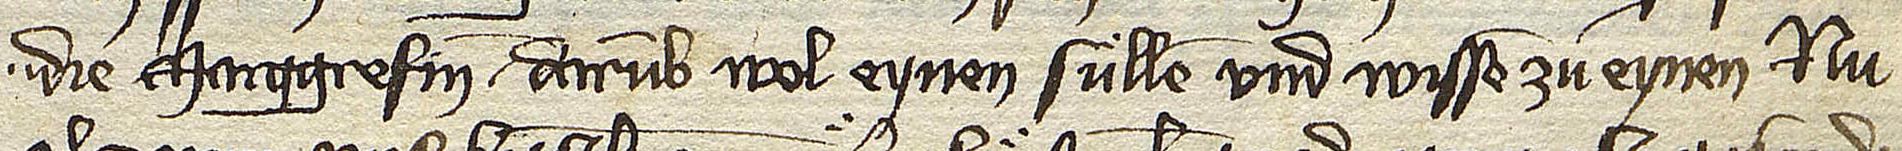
~ die Marggrefin / darub* wol eynen ſülle* vnd wiſſe* ʒu eynen Nu
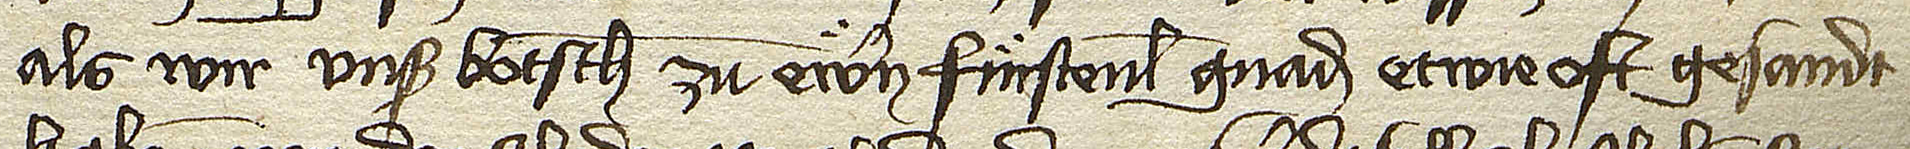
als wir vnſ* botſch* ʒu eẅn* fürſtenl* gnad* etwieoft geſandt
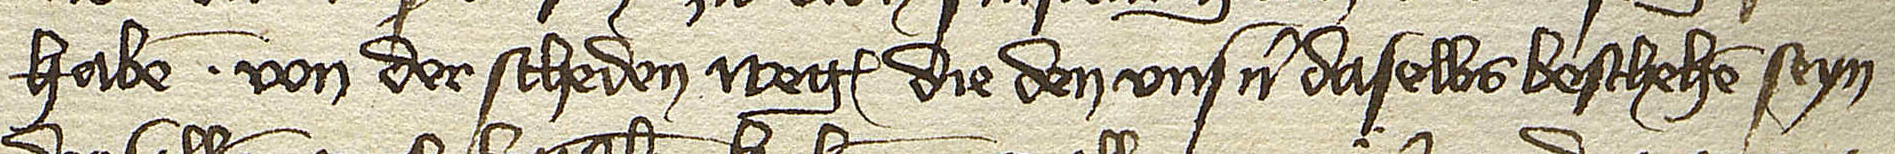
habe* . von der ſcheden weg* die den vnſ*n daſelbs beſchehe* ſeyn
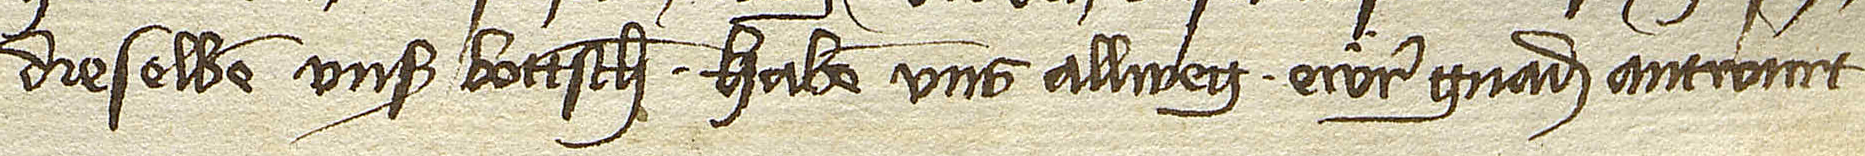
dieſelbe* vnſ* bottſch* . habe* vns allweg . eẅr* gnad* antwurt
